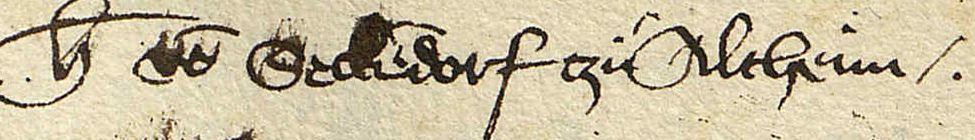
h* vo* Secke*dorf cʒü Altheim / .
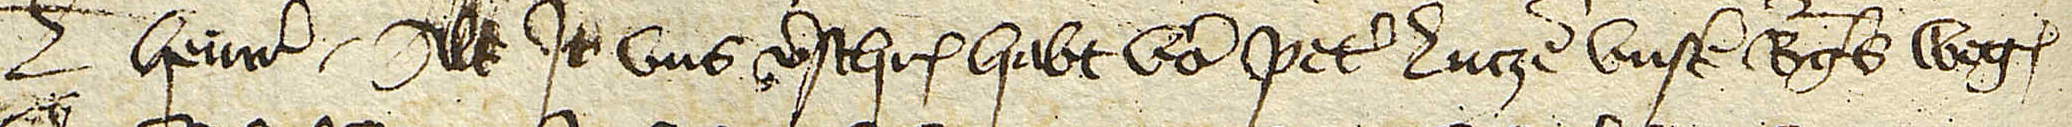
L* heinr* / Als Ir vns v*ſchr* habt vo* Pet* Lucʒe* vnſ*s B*g*s weg*
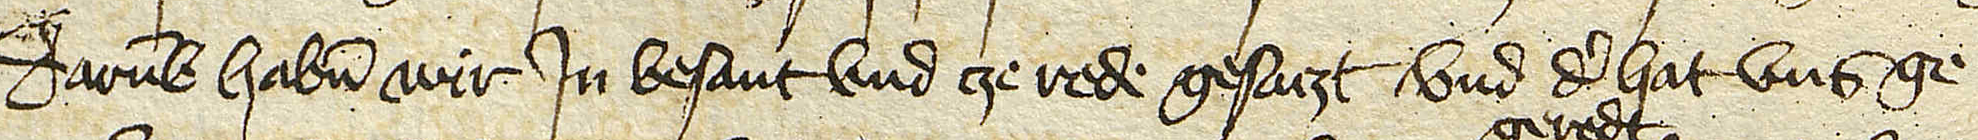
darüb* habn* wir In beſant vnd cʒe rede geſacʒt / vnd d* hat vns ge
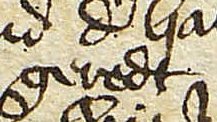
geredt
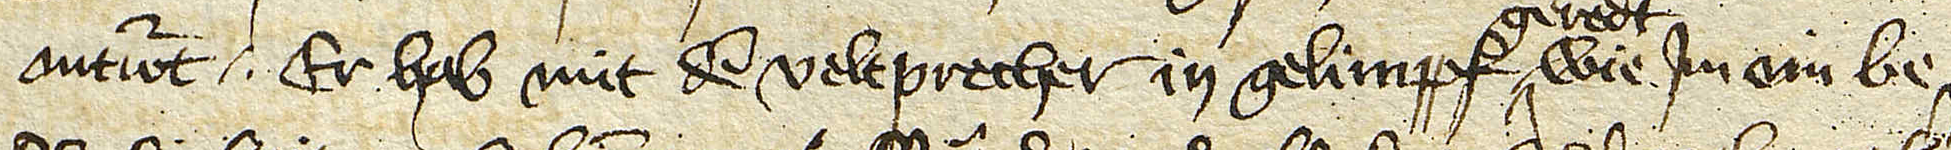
antw*t / . Er hab mit d* veltprecher in gelimpf / wie Im ein be
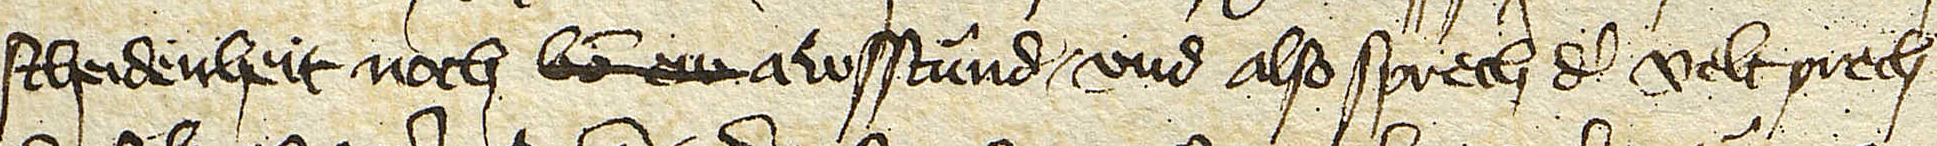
ſcheidenheit noch vo* ew awſſtünd / vnd alſo ſprech d* veltprech*
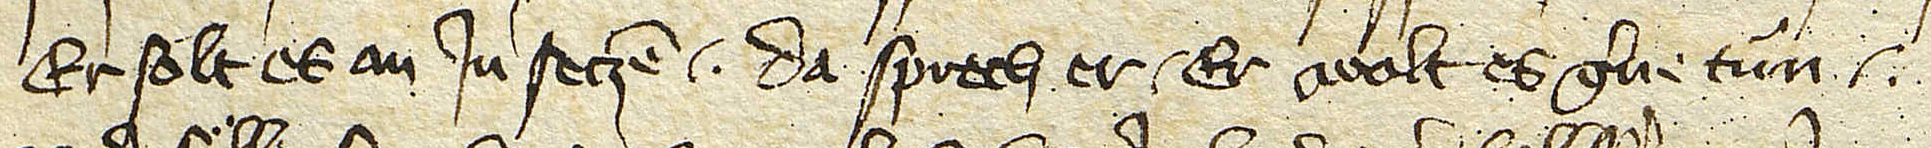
Er ſolt es an In ſecʒe* / . da ſprech er / Er wolt es g*ne tün / .
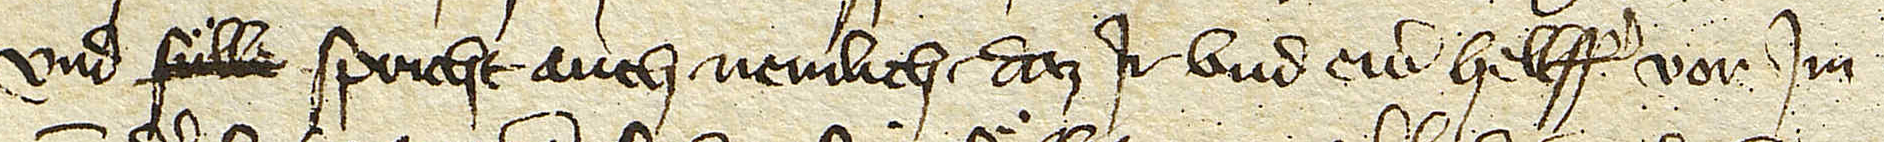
vnd ſülle ſpricht auch nemlich / daʒ Ir vnd ew* hellff* vor Im
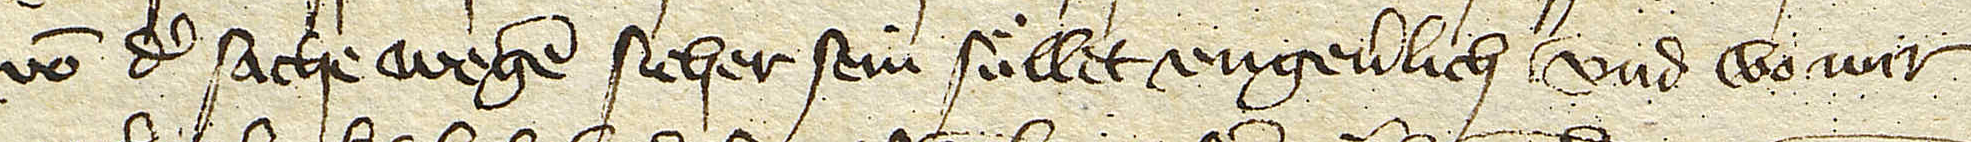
vo* d* ſache wege* ſicher ſein ſüllet vngen*lich / vnd wo wir
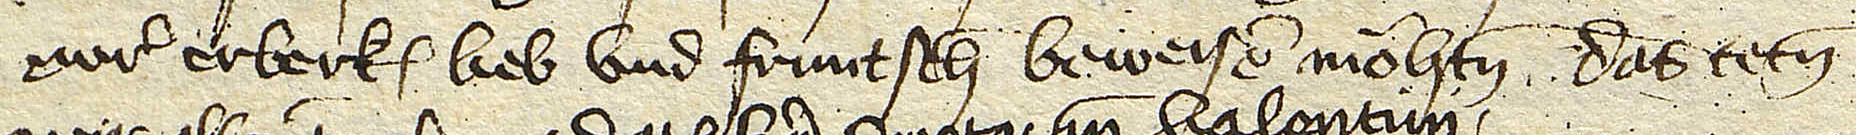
ewr* erberk* lieb vnd fruntſch beweiſe* möhtn* das tetn*
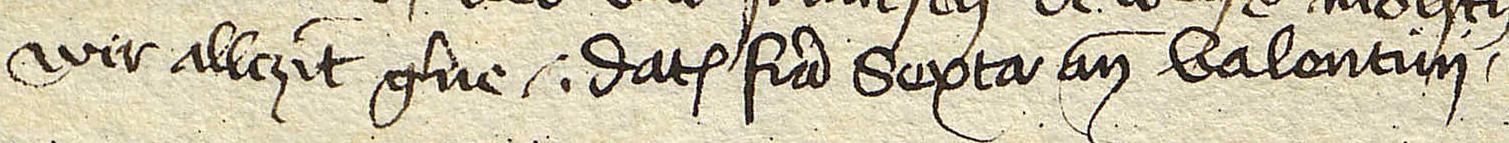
wir allcʒ*it g*ne / . dat* fia* Sexta an* valentini /
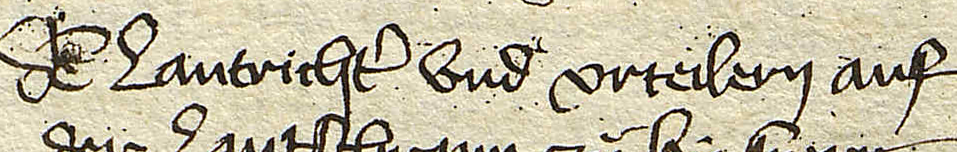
de* Lantricht* vnd vrteilern auf
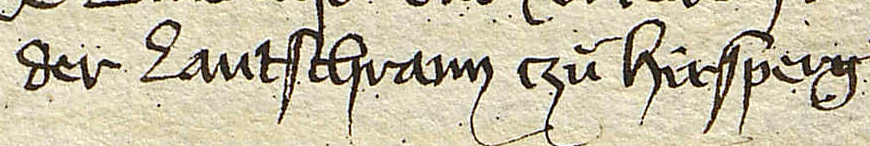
der Lantſchrann cʒü hirſperg
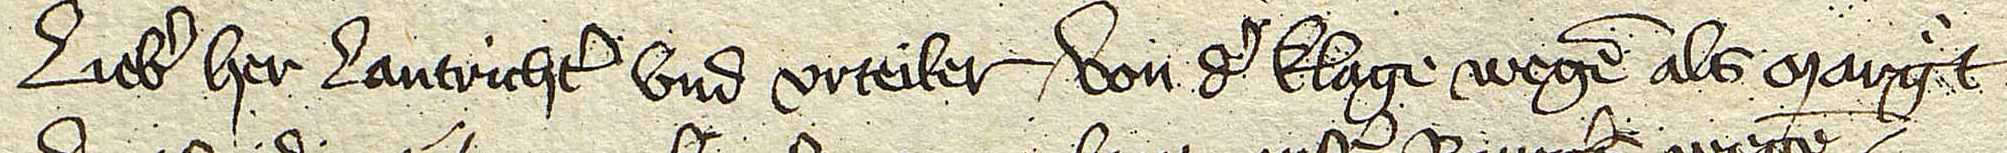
Lieb* her Lantricht* vnd vrteiler / Von d* klage wege* als Margot
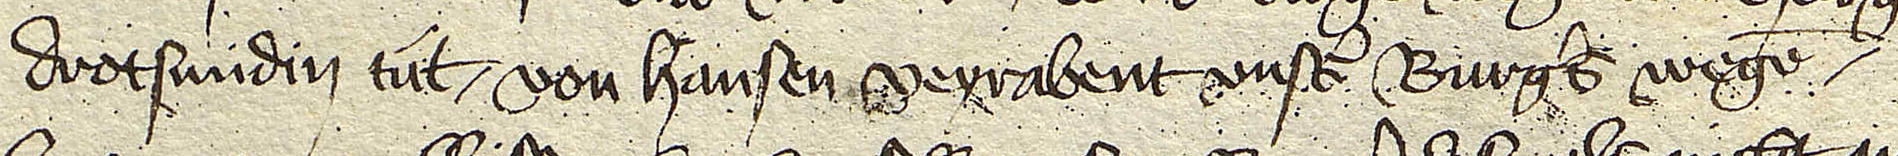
drotſmidin tüt / von hanſen Veyrabent vnſ*s Burg*s wege* /
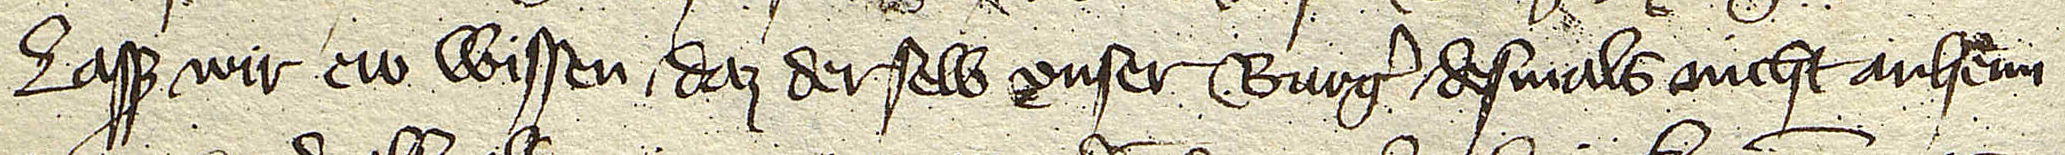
Laſſ* wir ew wiſſen / daʒ derſelb vnſer Burg* / deſmals nicht anheim
